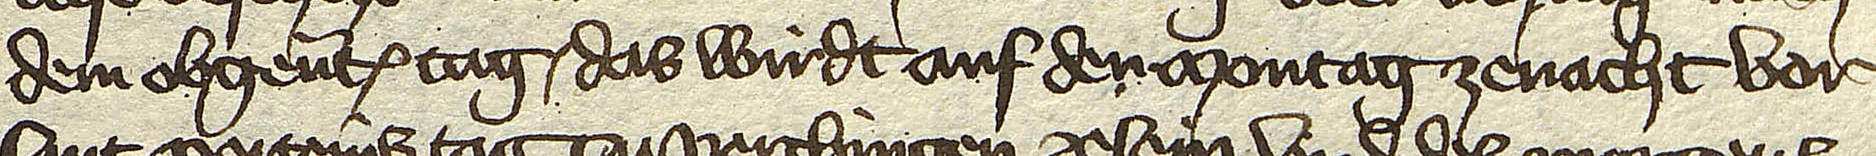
dem obgent* tag / das wirdt auf den Montag cʒenacht vor
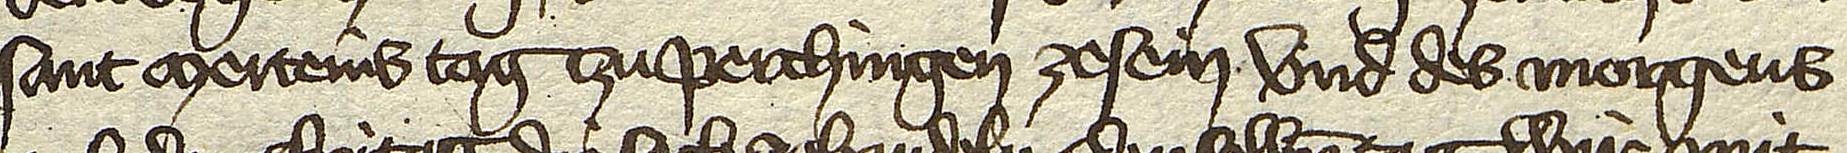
ſant Merteins tag cʒu Perchingen ʒeſein vnd des morgens
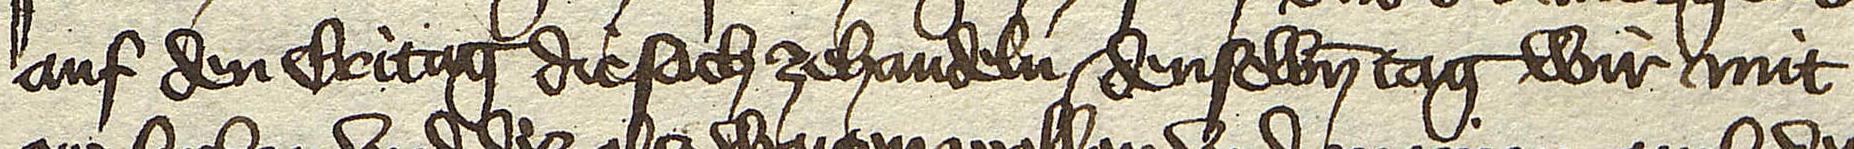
auf den Eritag die ſach ʒehandeln / denſelbn* tag wir mit
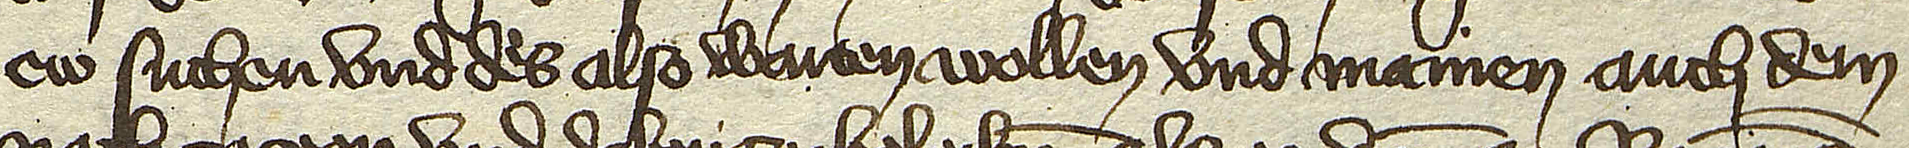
ew ſuchen vnd des alſo warten wollen vnd mainen auch dem
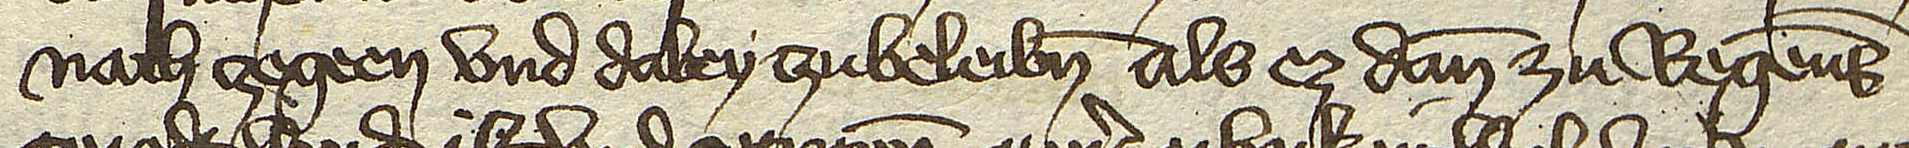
nach cʒegeen vnd dabey cʒubeleibn* als eʒ dan* ʒu Regens*
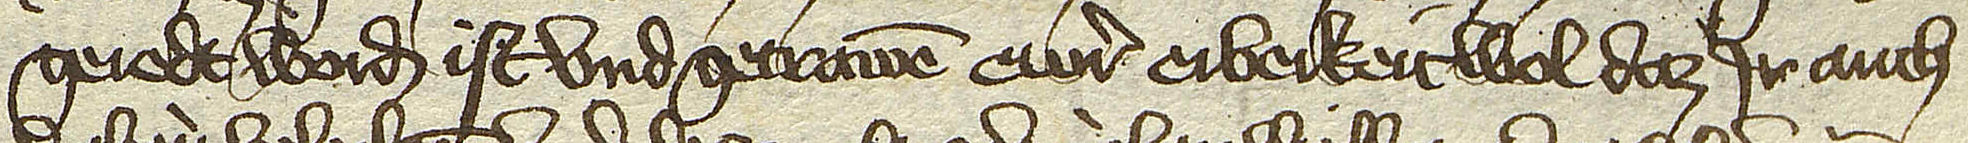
geredt word* iſt vnd getrawe* ewr* erberkeit wol daʒ Ir auch
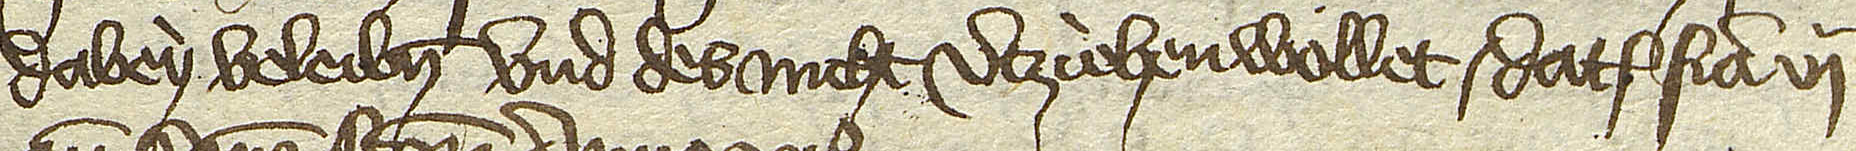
dabey beleibn* vnd des nicht v*cʒiehen wöllet / dat* fia* vi*
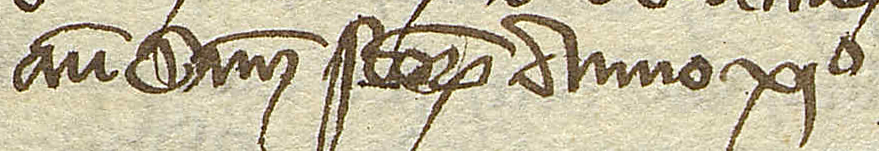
an* Omi* ſco* Anno xi*
